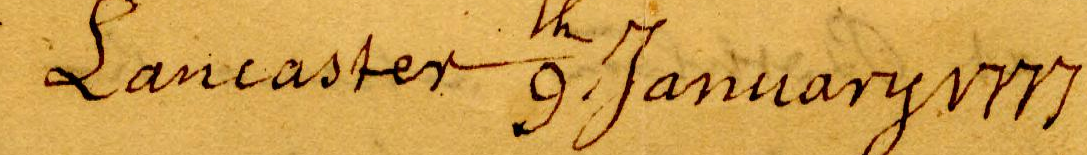Lancaster 9^th January 1777.
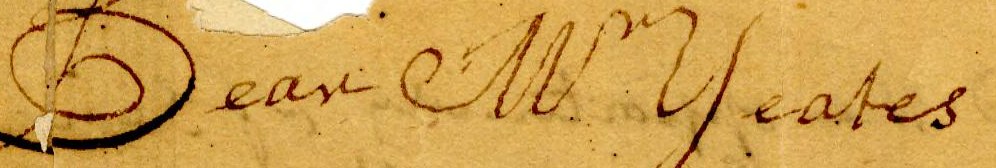Dear M^r. Yeates
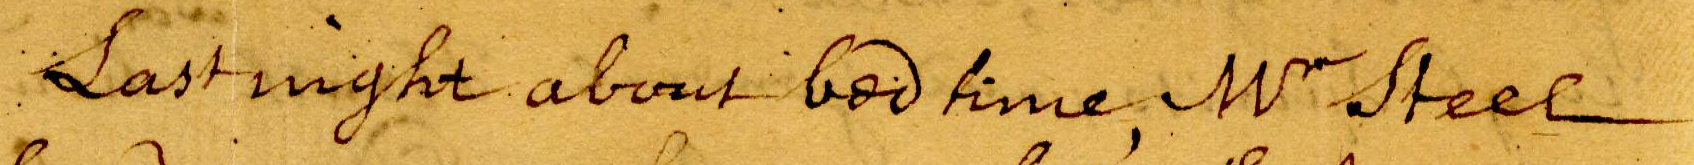Last night about bed time M^r. Steel
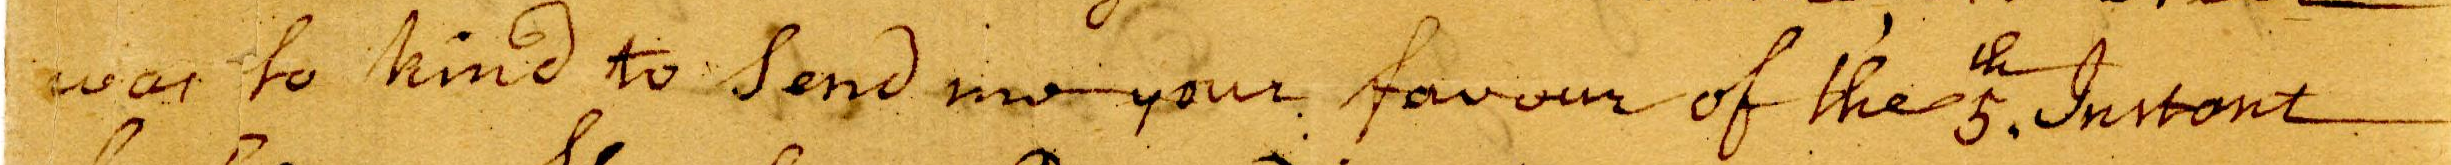was so kind to send me your favour of the 5^th. Instant
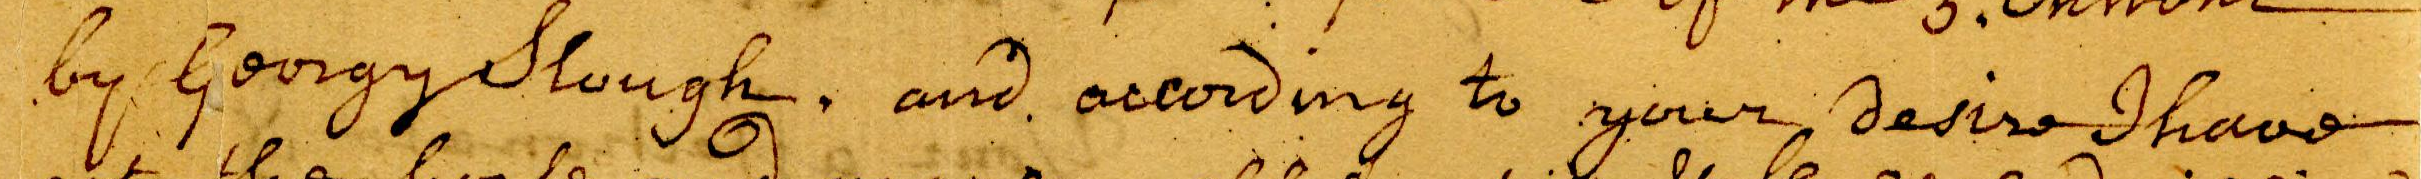by Georgy Slough, and according to your desire I have
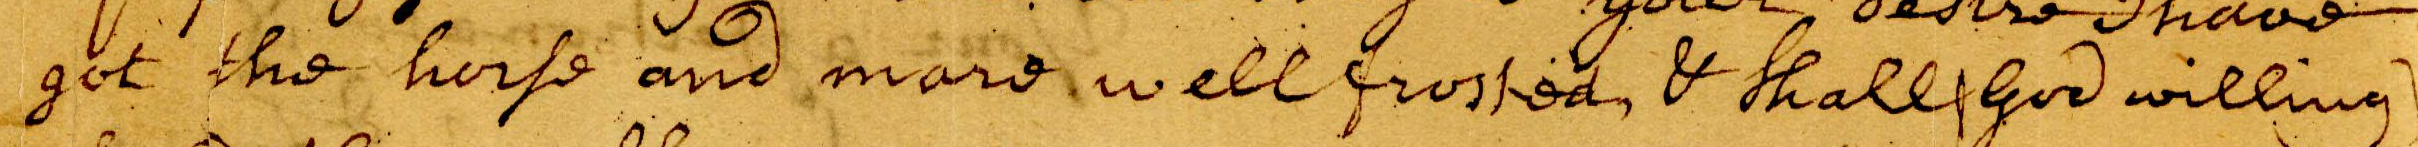got the horse and mare well rested & Shall God willing
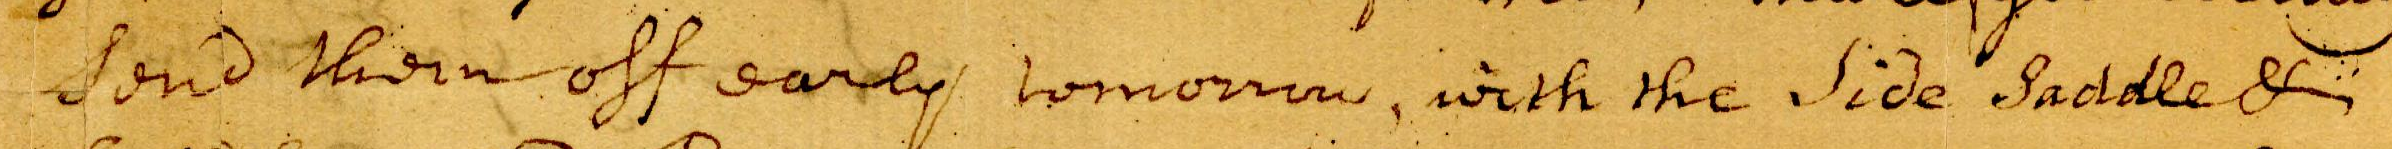send them off early tomorrow, with the Side Saddle &
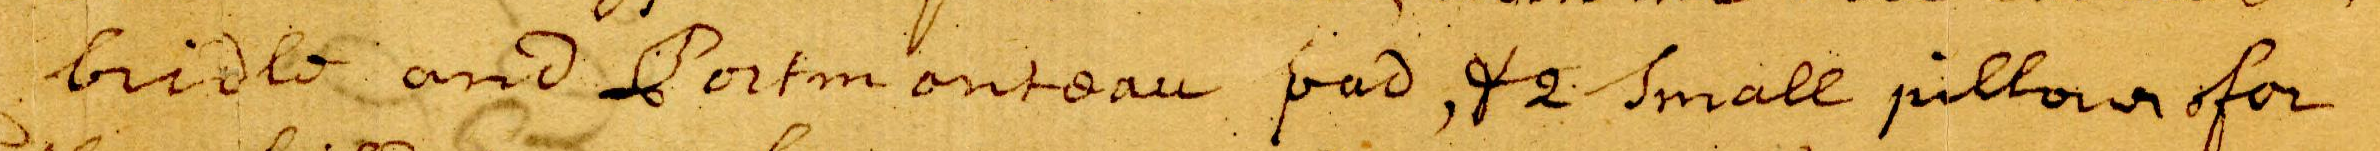bridle and Portmanteau pad, & 2 Small pillows for
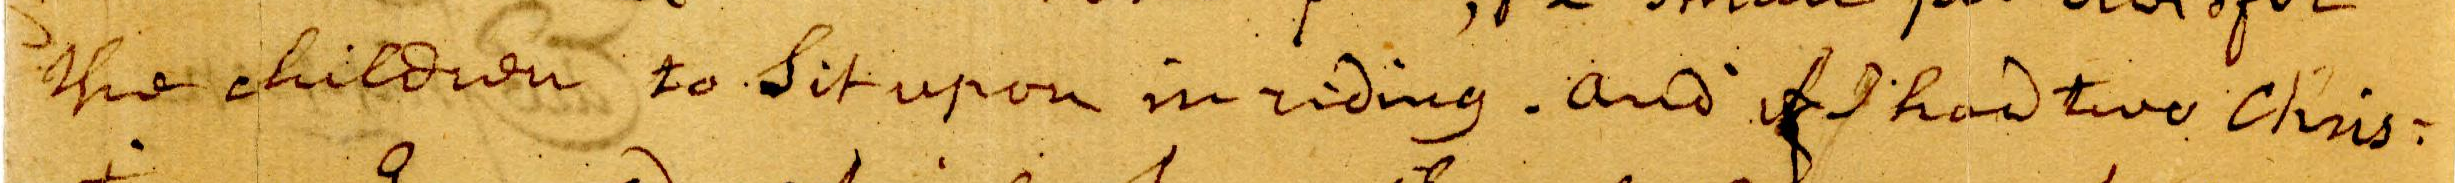the children to Sit upon in riding, and if I had two chris-
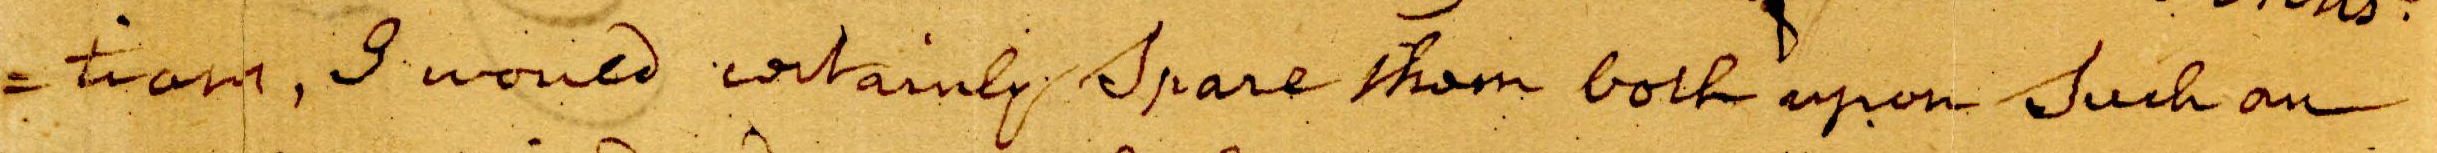-tians, I would certainly Spare them both upon such an
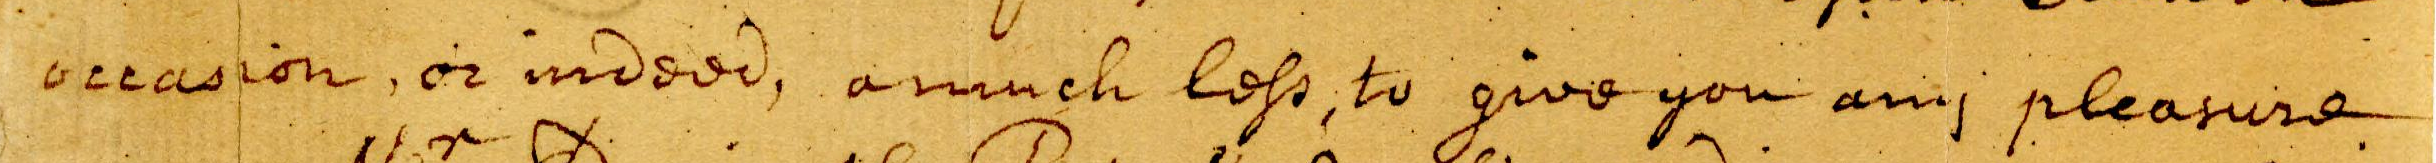occasion, or indeed, a much loss to give you any pleasure
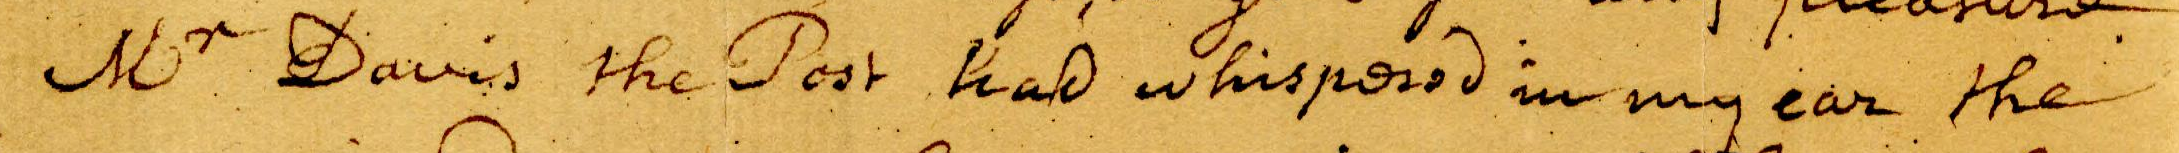M^r Davis the Post had whispered in my ear the
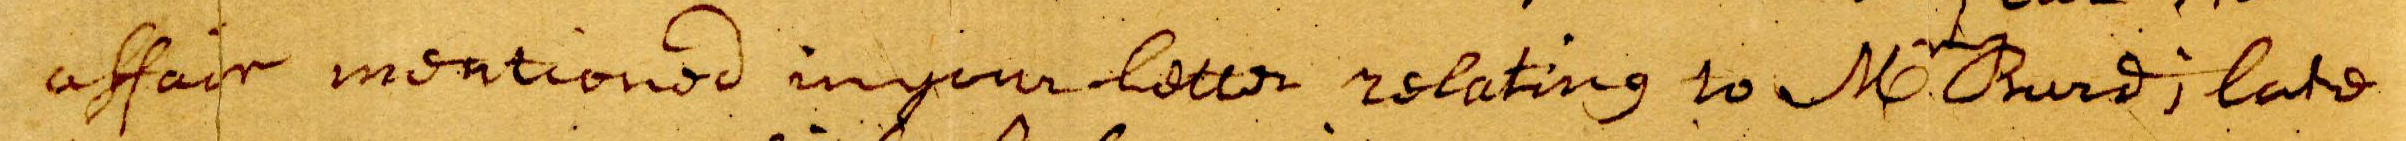affair mentioned in your letter relating to M^r Burd; take
